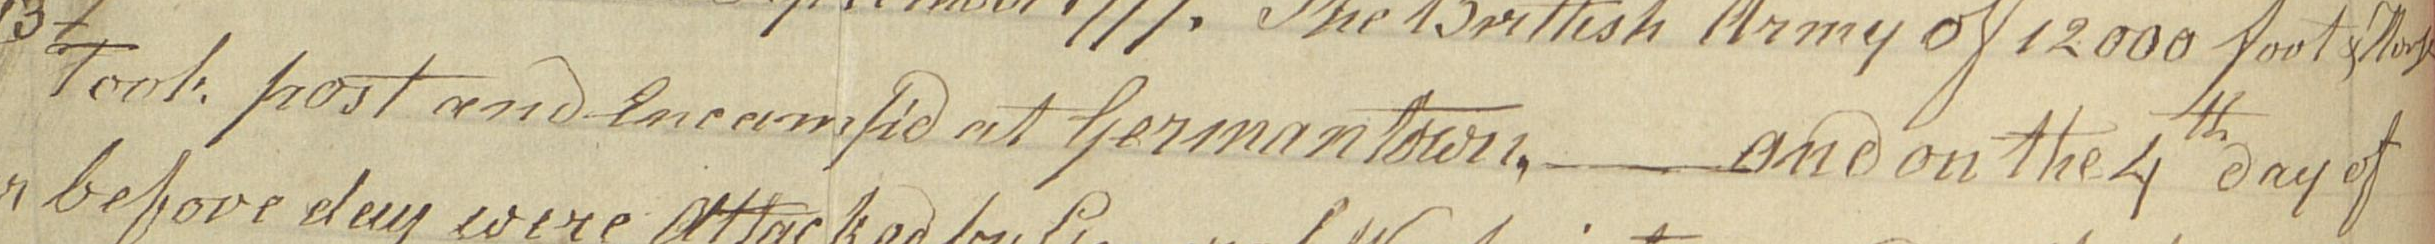Took post and Encamp'd at Germantown, and on the 4^th day of
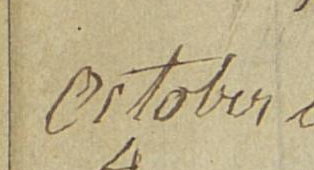October
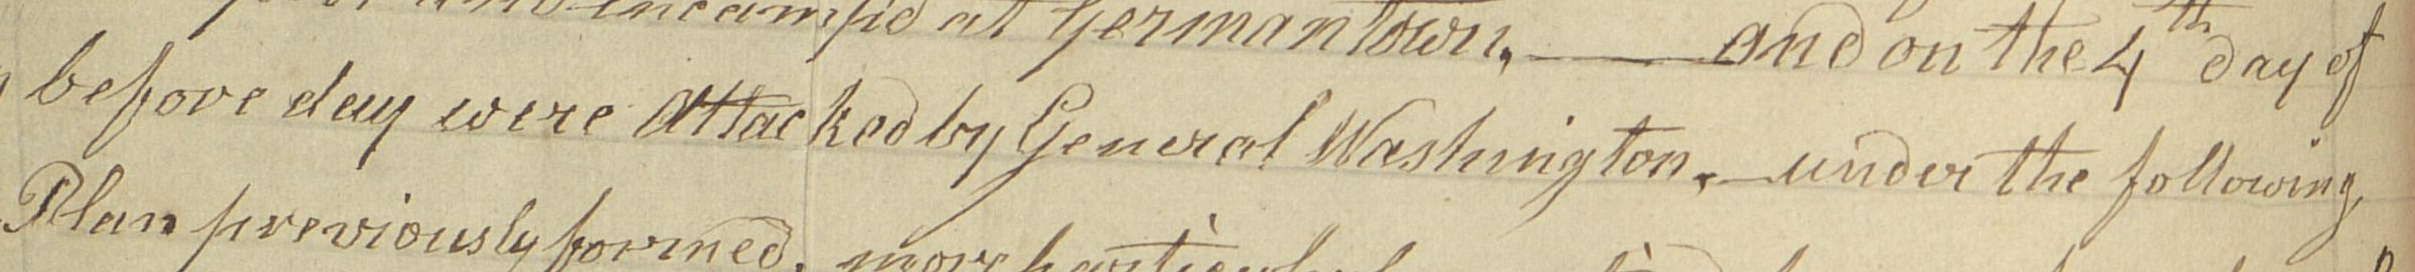before day were attacked by General Washington, under the following,
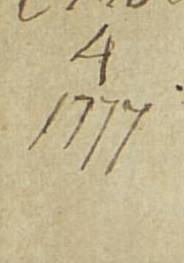4
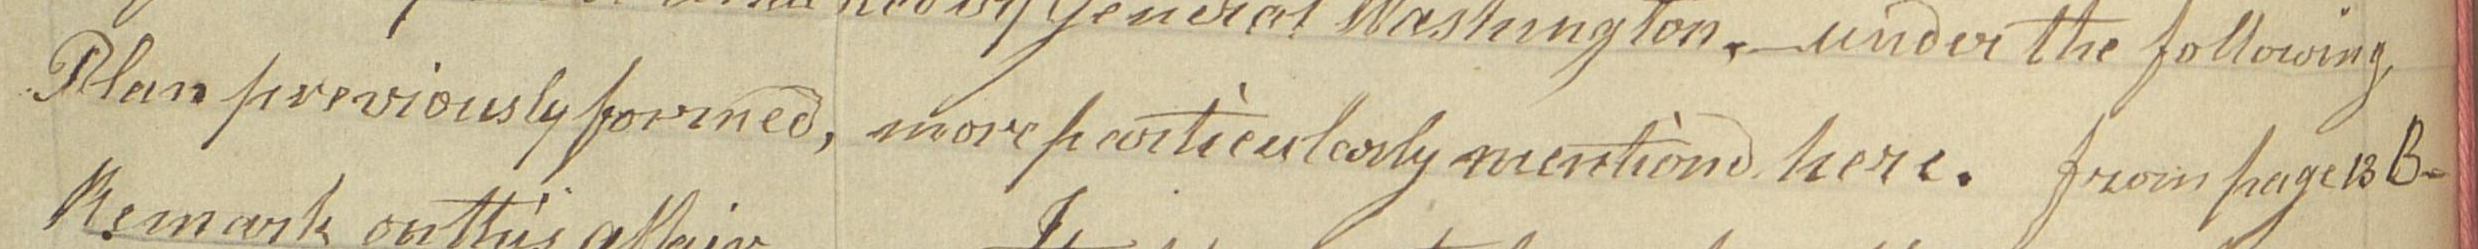Plan previously formed, more particularly mentiond here. from page 13 B
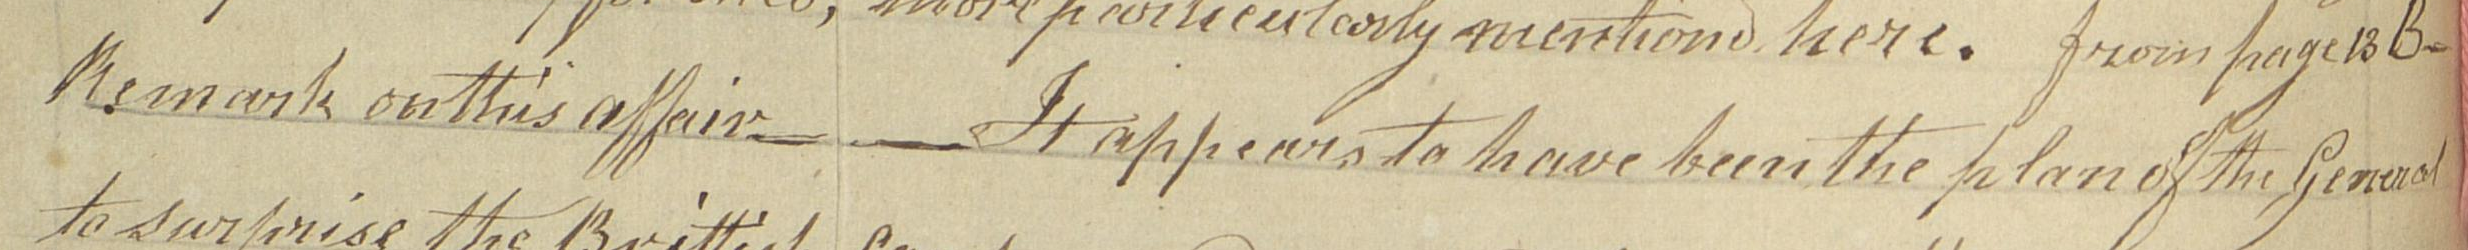Remark on this affair. It appears to have been the plan of the General
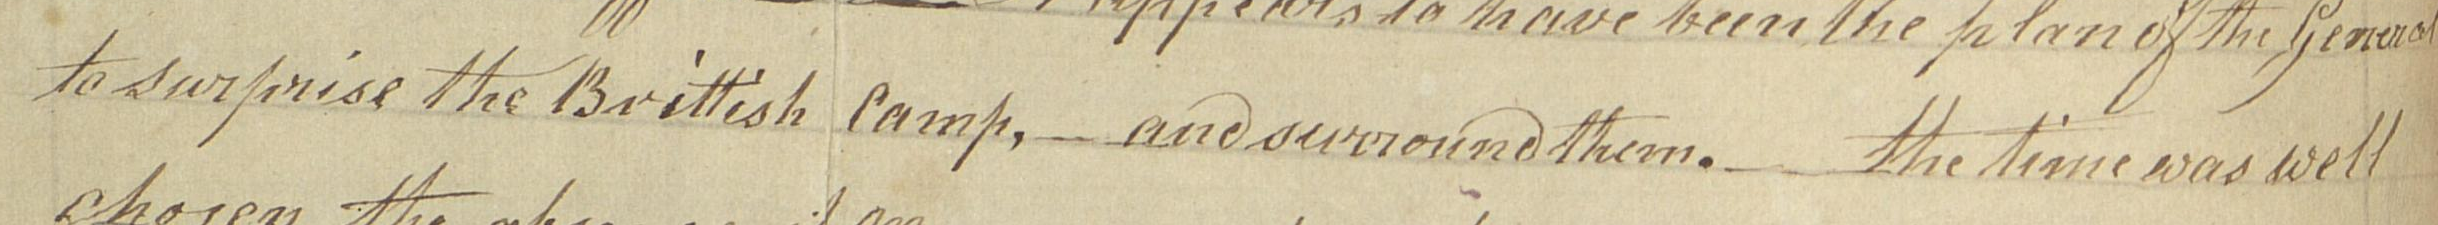to surprise the British Camp, and surround them. the time was well
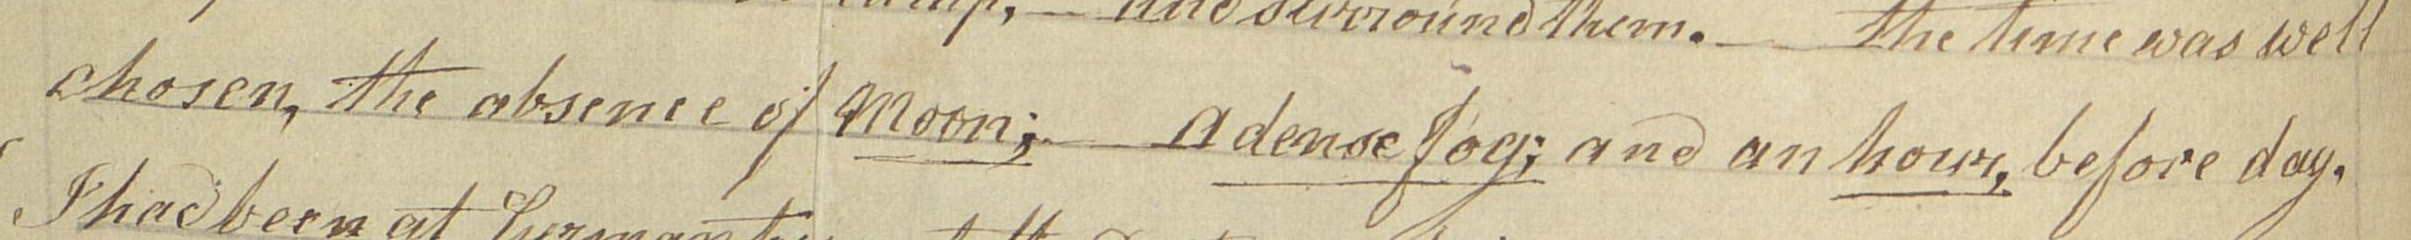chosen, the absence of moon; A dense fog; and an hour, before day,
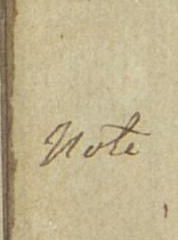note
